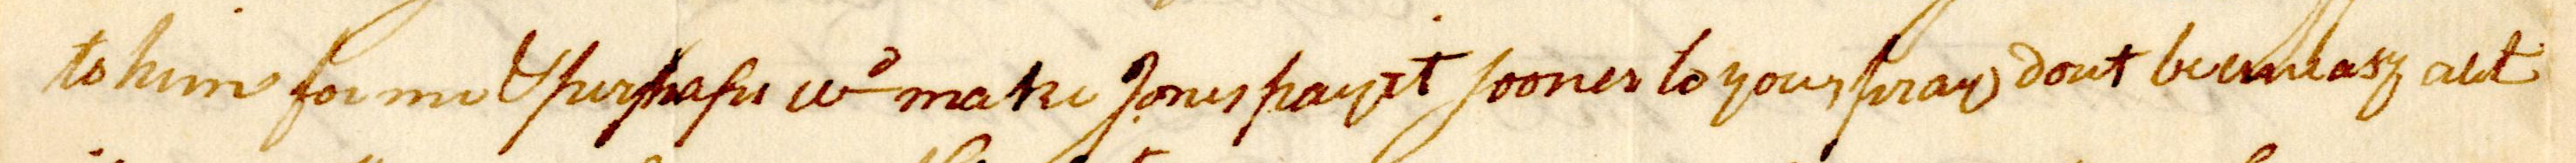to him for me & perposs w^d. make Jones pay it sooner to you pray dout be uneasy abt
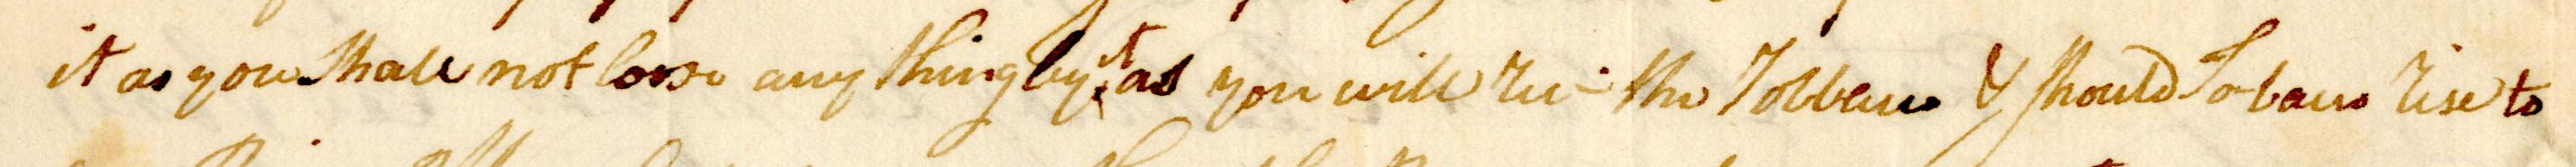it as you Shall not lose any thing by it as you will rec- the Tobacco & should Tobacco rise to
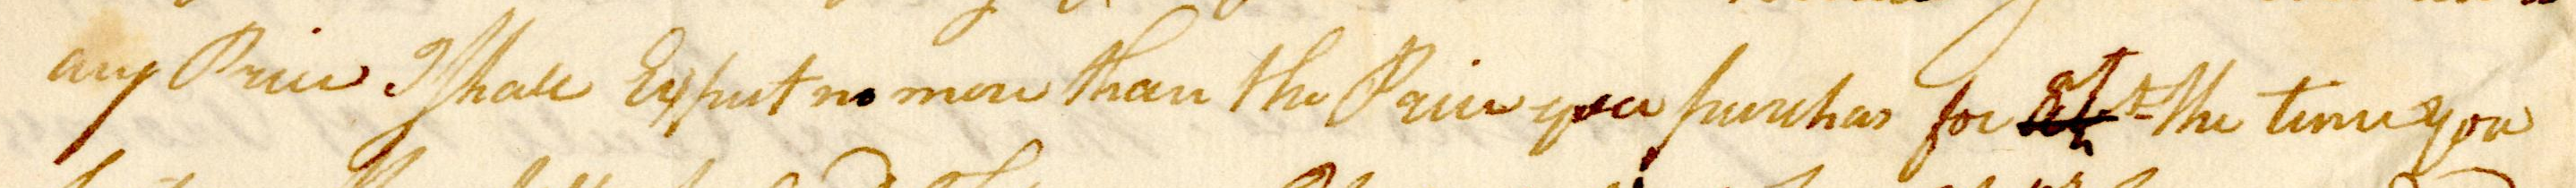any Price I shall Expect no more than the Price you purchas for at the time you
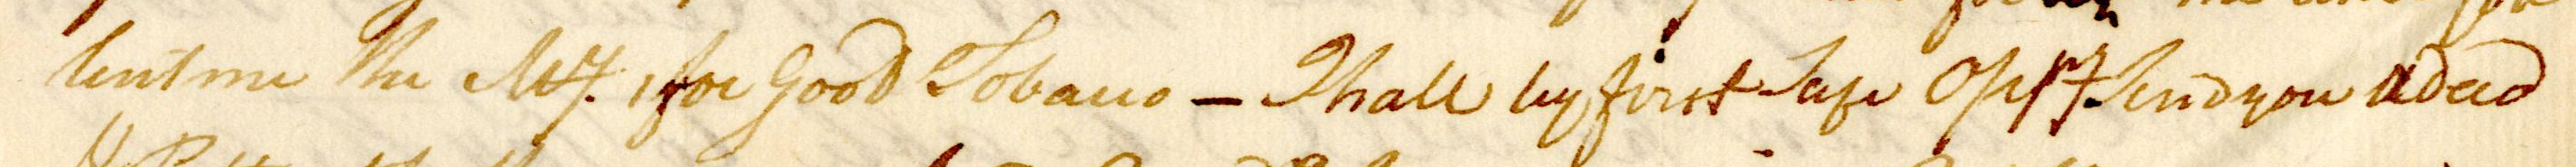sent me the let. for Good Tobacco- Shall by first Safe opp^y. Send you A deed
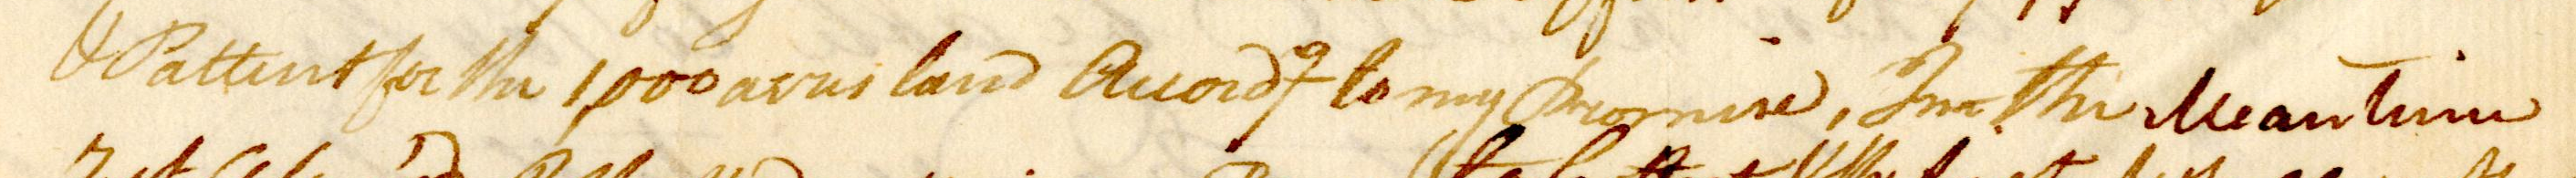& Pattent for the 1,000 acres land accord^g to my promise, In the meantimes
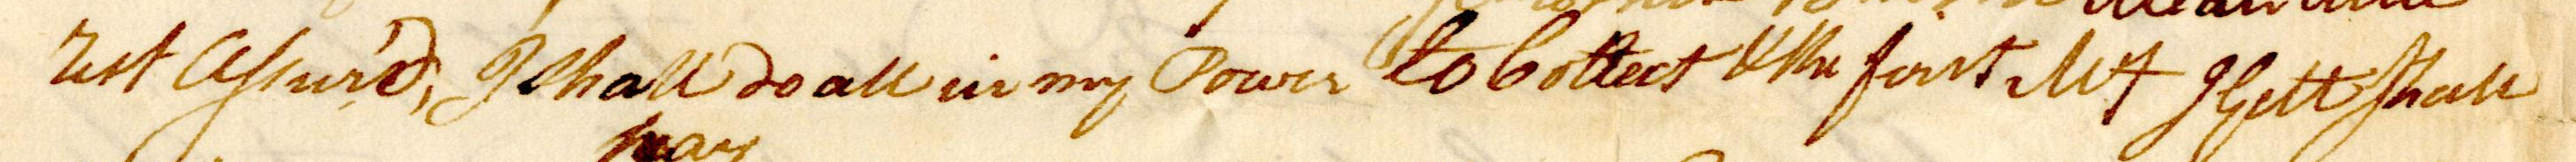rest Assur'd, I shall do all in my Power to Collect & the first let I get shall
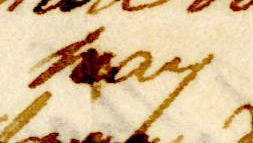pay
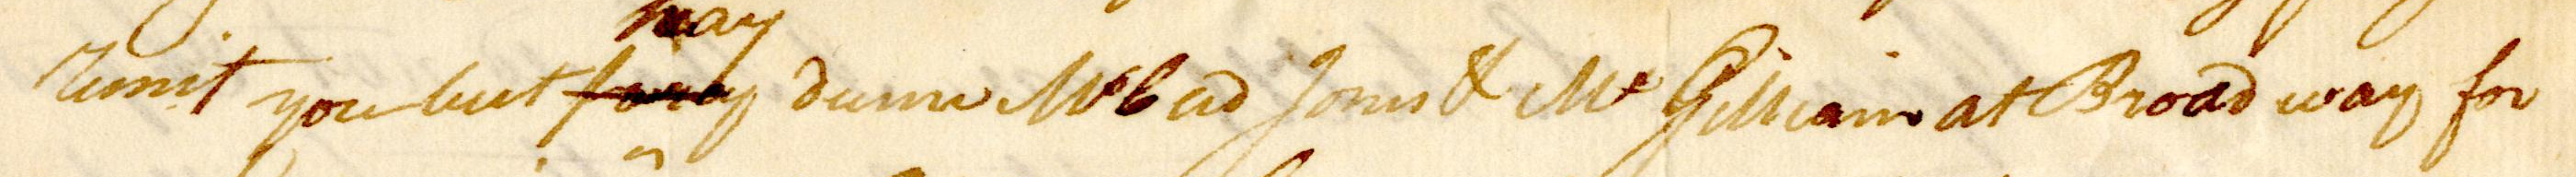remit you but [____] dume M^r Cad Jones & M^r Gillian at Broadway for
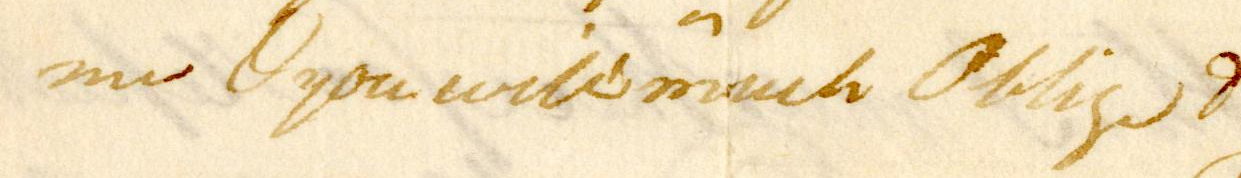me & you will much Oblige
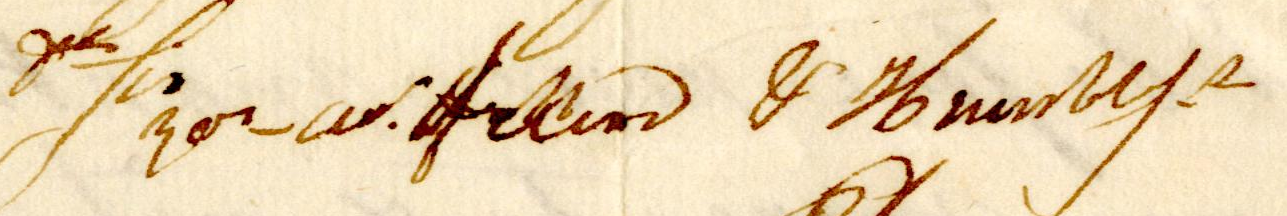D^r Sir I am. affection & Humble S^t
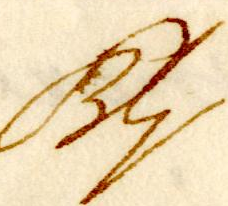BG
